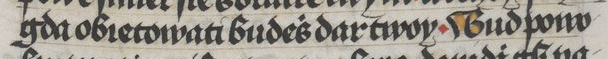gda obietowati budeṡ dar twoy.Bud powo¬
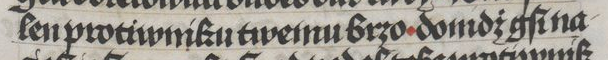len protiwníku twemu brzo.donidż gſi na¬
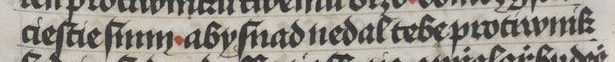cieſtie ſnim.abyſnad nedal tebe protiwnik
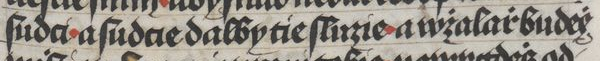ſudci.A ſudcie dalby tie ſluzie a wżalaṙ budeż
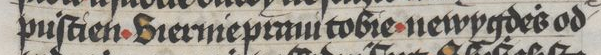puſtien.viernie praui tobie.newygdeṡ od¬
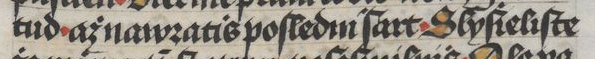tud.aż nawratiṡ poſledni ẛart.Slyẛieli ſte
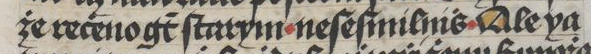że reċeno ḡt ſtarym.neſeſmílníṡ.Ale ya
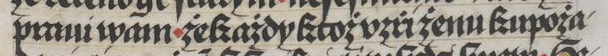praui wam.żekażdy ktoż vzṙí żenu kupoża¬
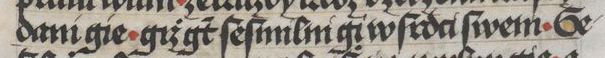daní gíe.giż ḡt ſeſmilni gi w ſrdci ſwem.Ge¬
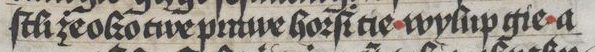ſtli że oko twe prawe horẛi tie.wylup gie.a
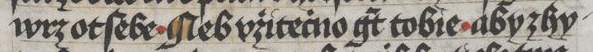wrz otſebe.Neb vżitečno ḡt tobie.aby zhy¬
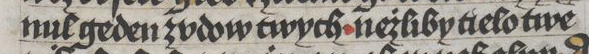nul geden zvdow twych.neżliby tielo twe
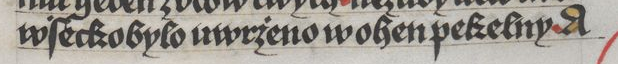wẛecko bylo uwrżeno w ohen pekelny.A
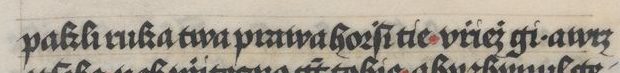pakli ruka twa prawa horẛi tie.vṙież gi.a wrz
